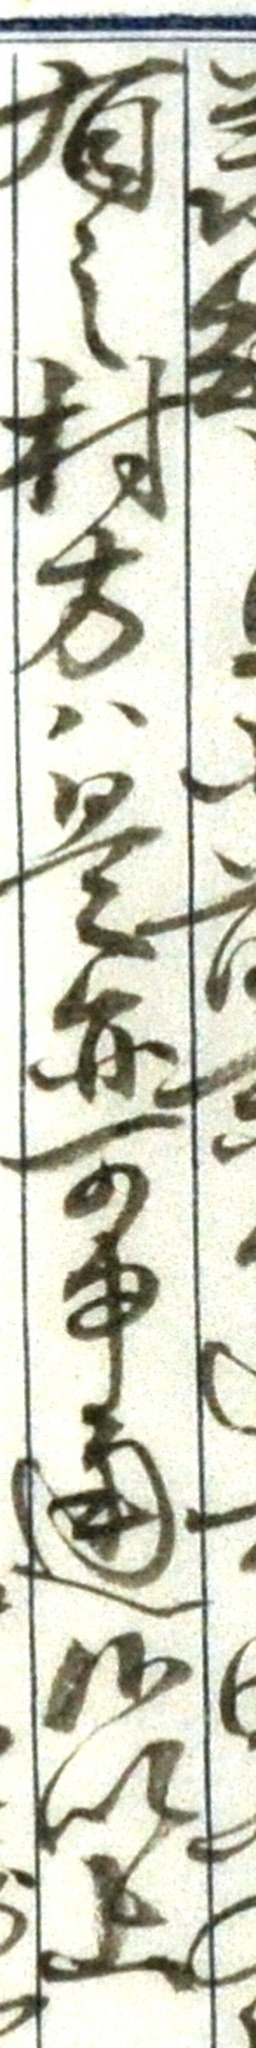有之村方は是亦可申通候以上

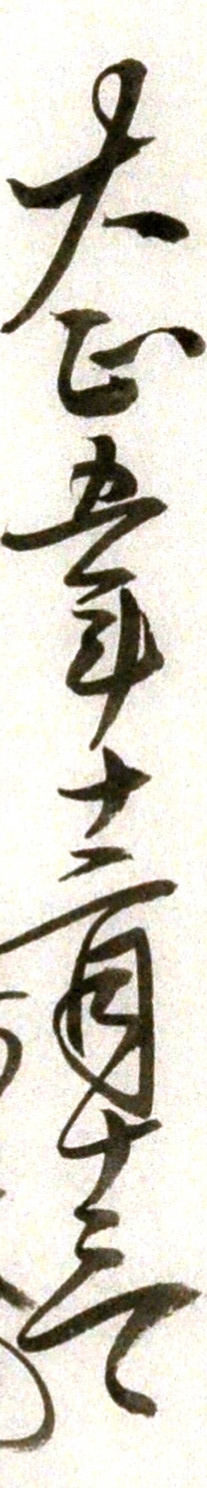大正五年十二月十三日
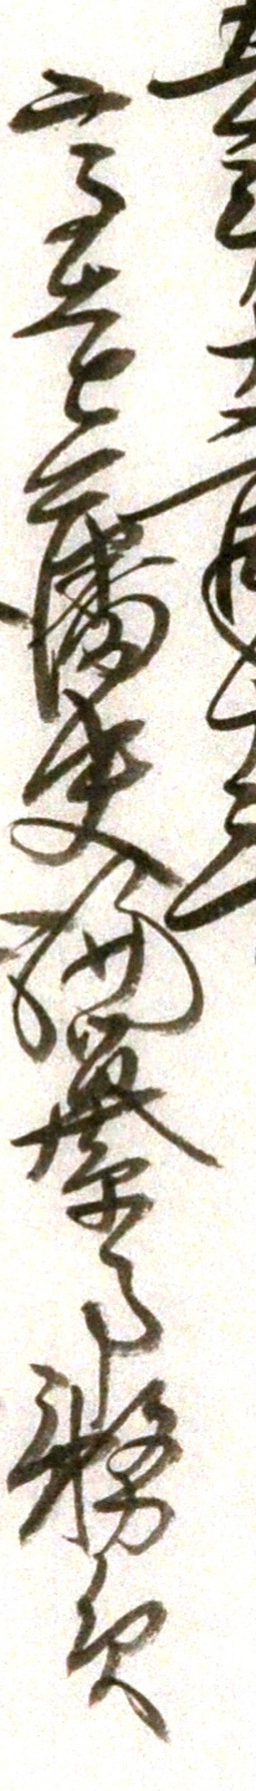高遠藩史編纂事務員
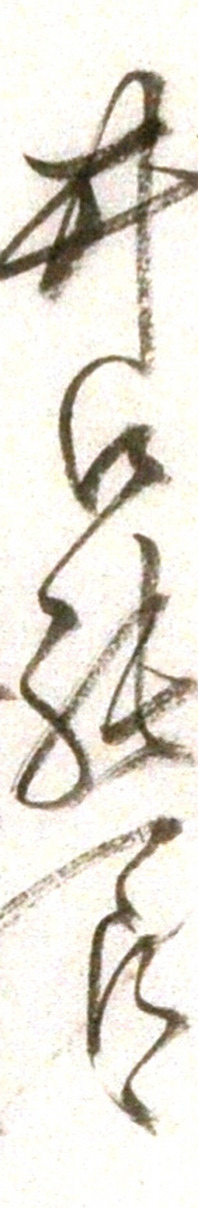井口純一郎
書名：潤緩方御触書
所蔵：伊那市立高遠町図書館・合同会社AMANE
